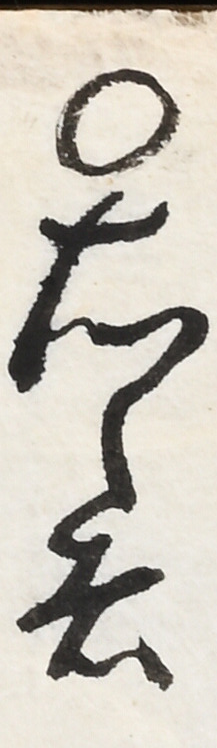〇右之者
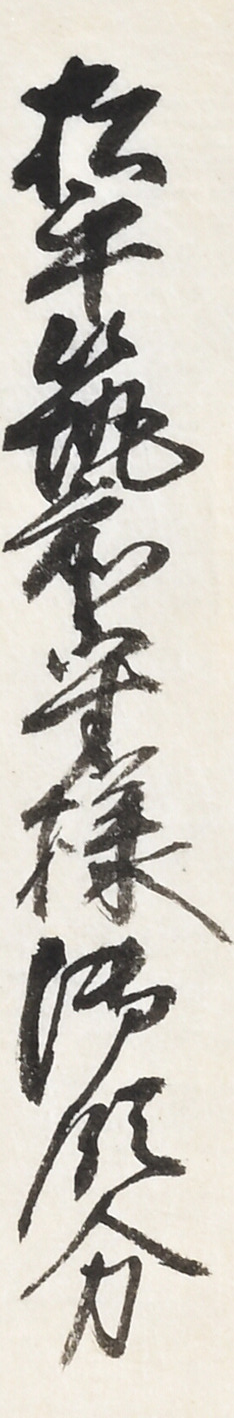松平筑前守様御領分
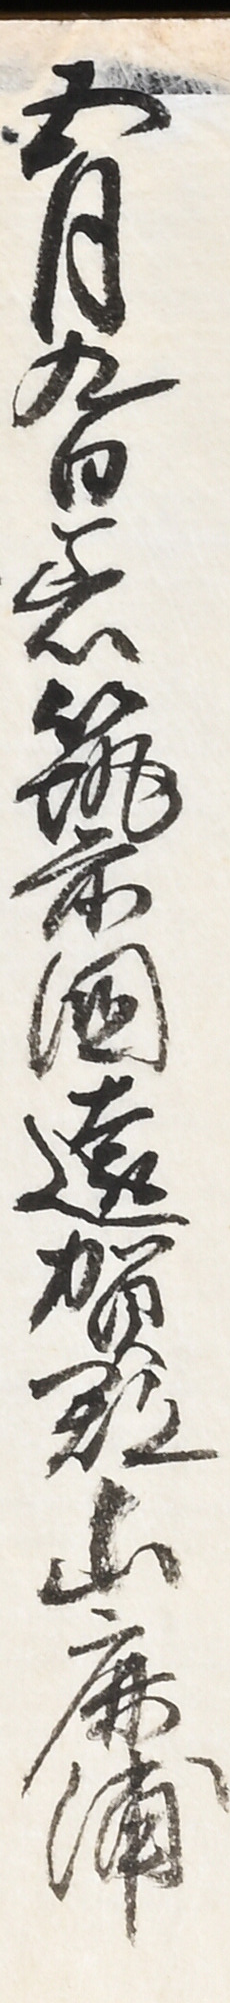五月九日着筑前国遠賀郡山鹿浦
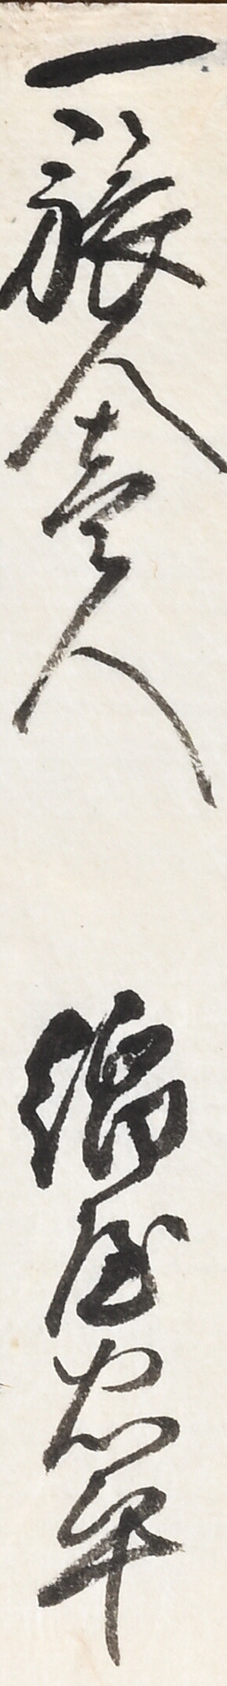一旅人壱人綿屋忠平
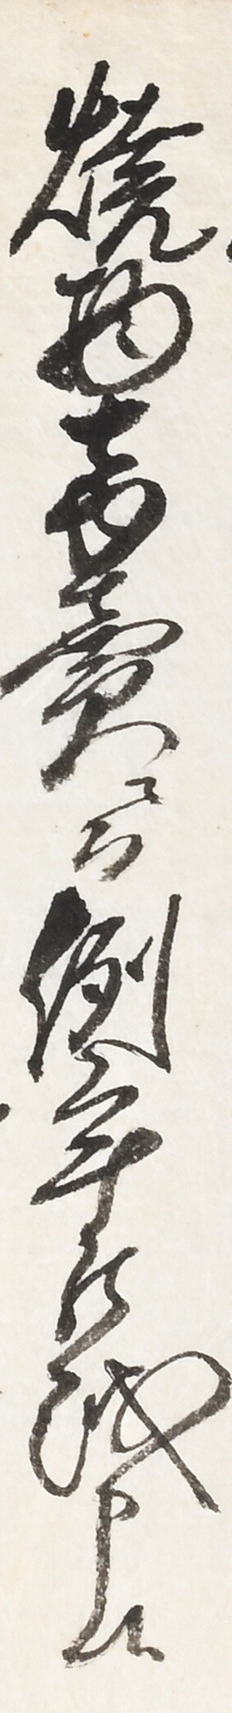焼物商売ニ而例年罷越申候
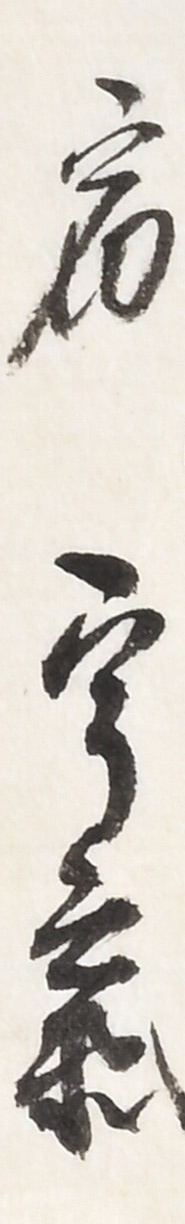宿宇兵衛
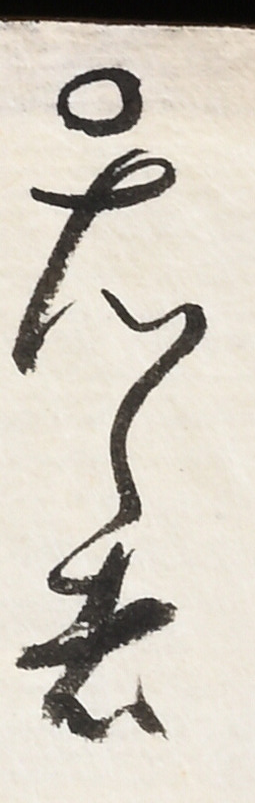〇右之者
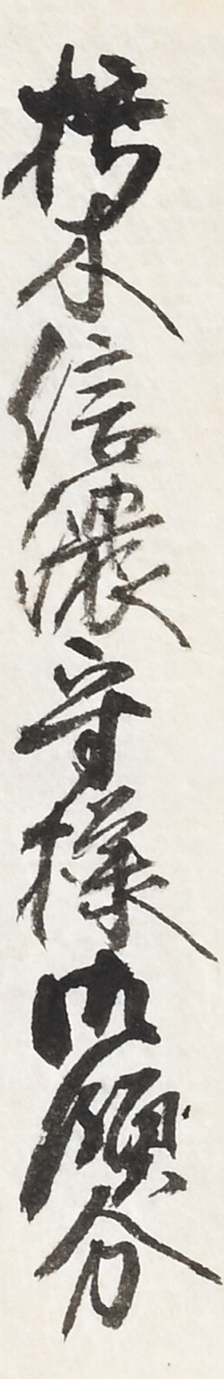朽木信濃守様御領分
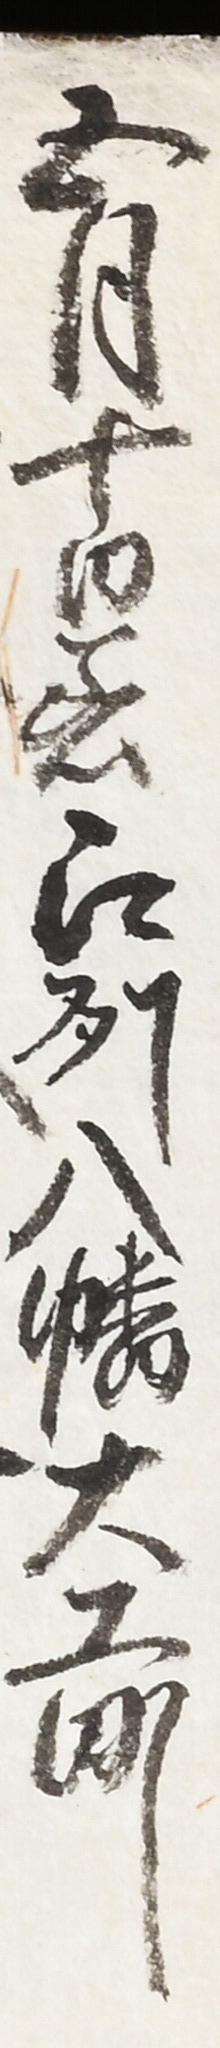五月十日着江州八幡大工町
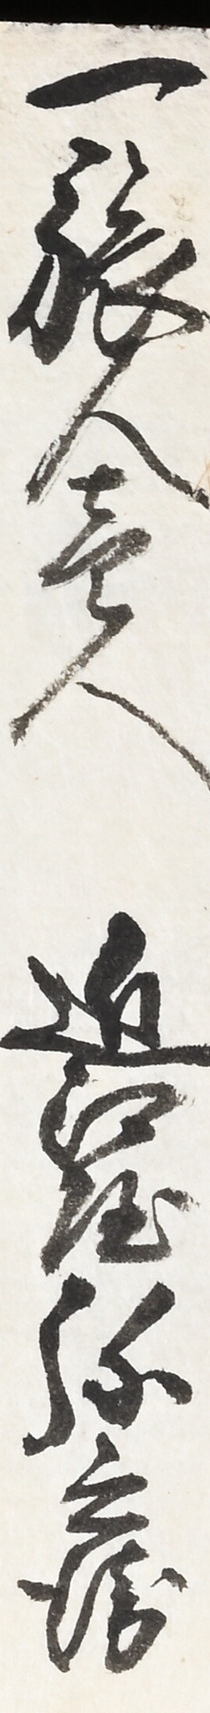一旅人壱人近江屋弥兵衛
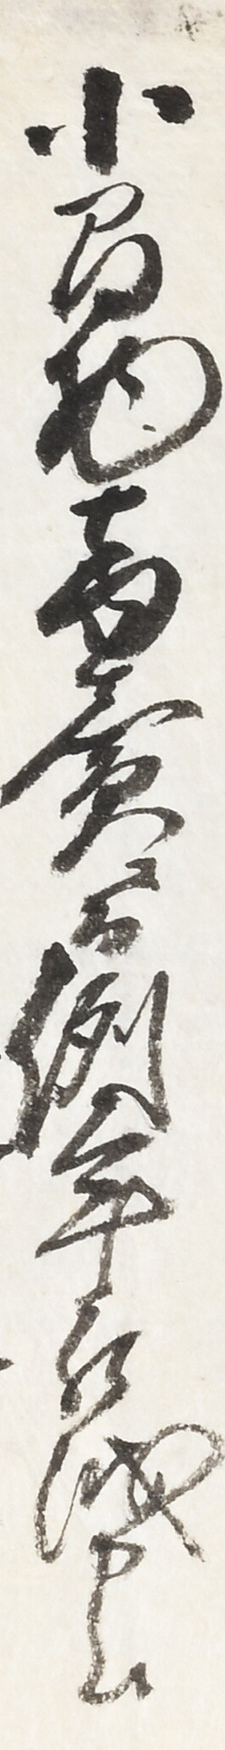小間物商売ニ而例年罷越申候
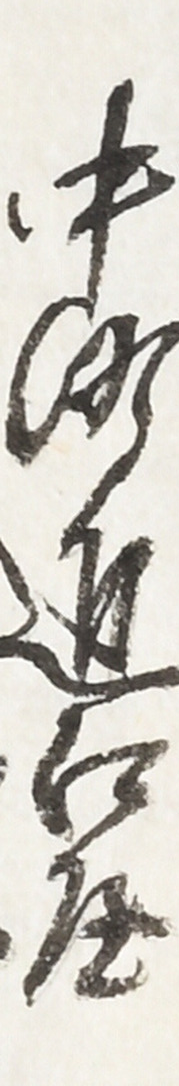中町近江屋
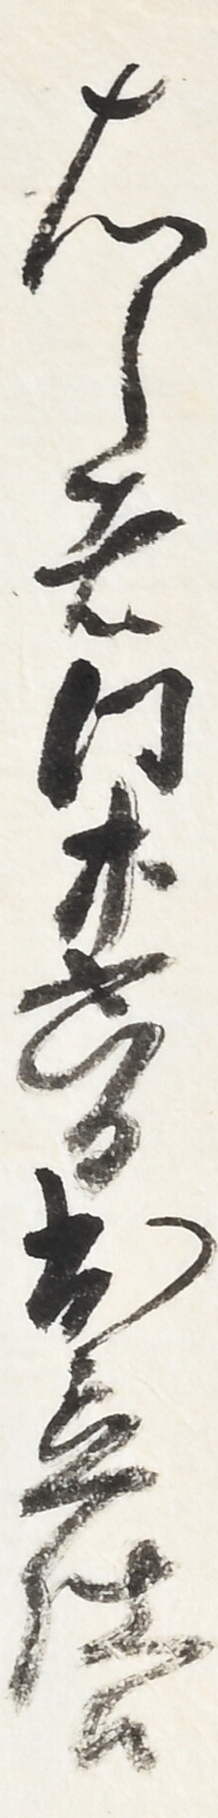右之者同廿六日出立仕候
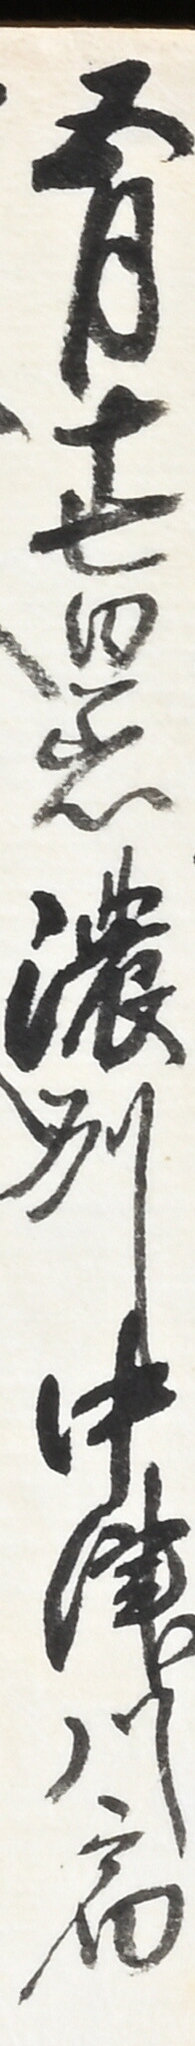五月十七日着濃州中津川宿
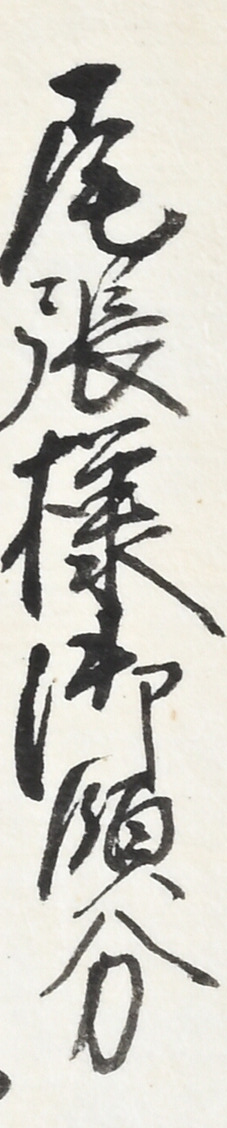尾張様御領分
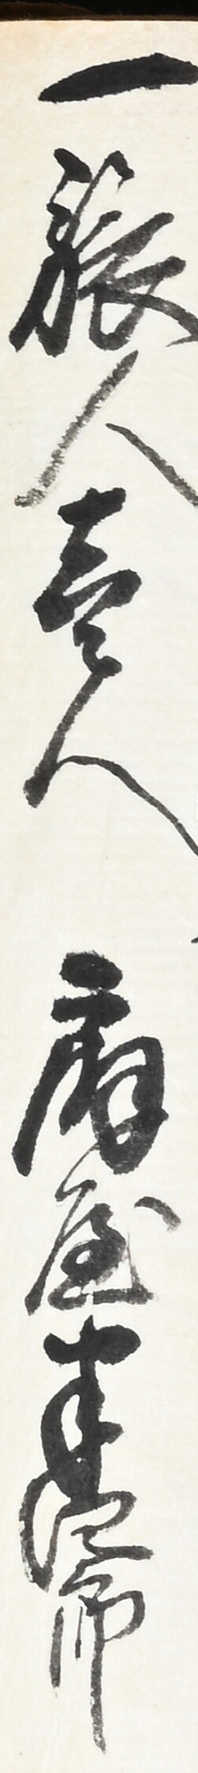一旅人壱人扇屋半四郎
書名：旅人泊控帳
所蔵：伊那市立高遠町図書館・合同会社AMANE
